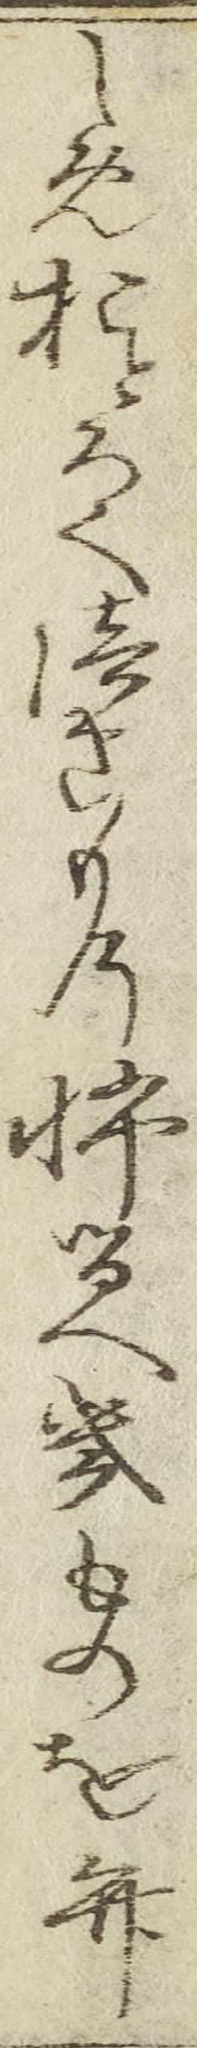しめおとろくへきもの怖るへきものを弁
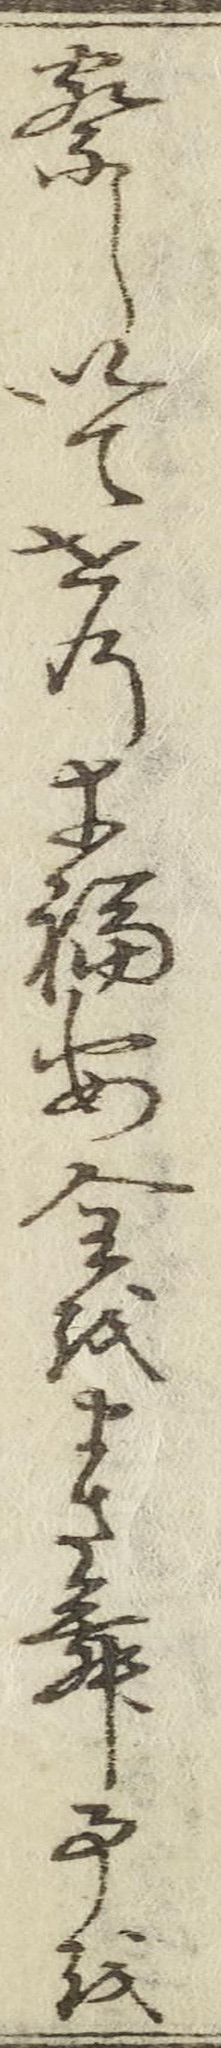察し以て世の幸福安全をまさむ事を
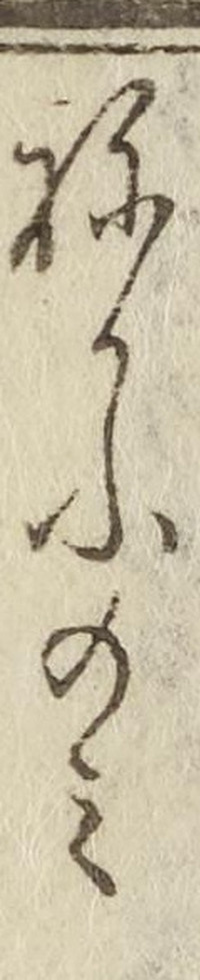ねかふのみ
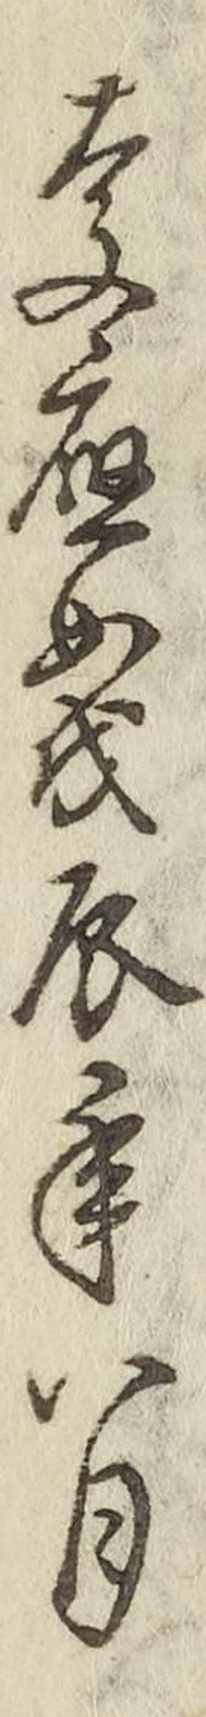慶応四戊辰年八月
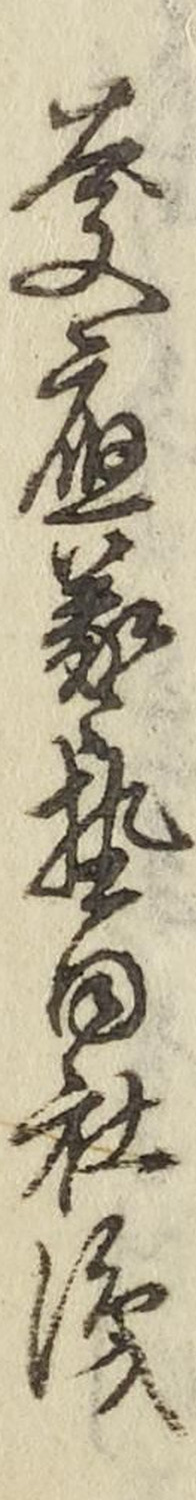慶應義塾同社識
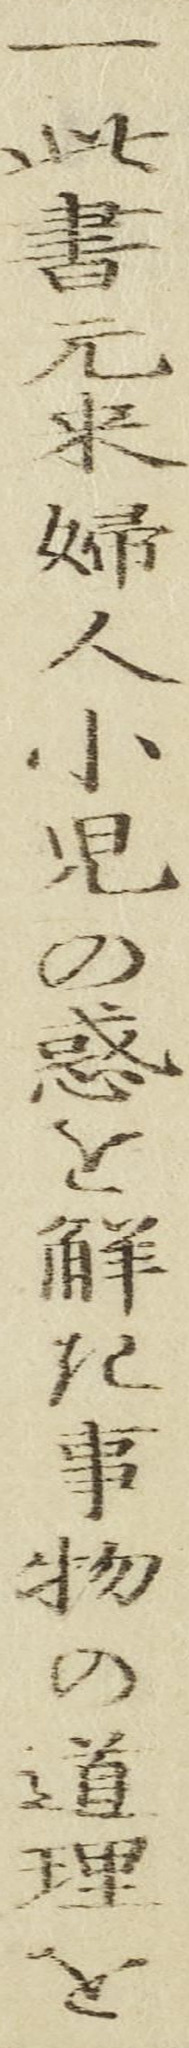一此書元来婦人小児の惑を解き事物の道理を
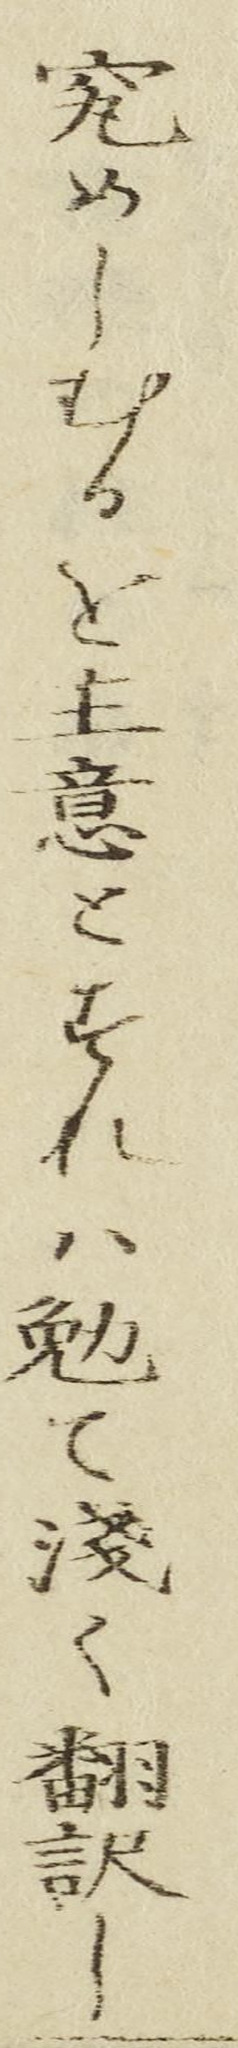究めしむるを主意とすれは勉て浅く翻訳し
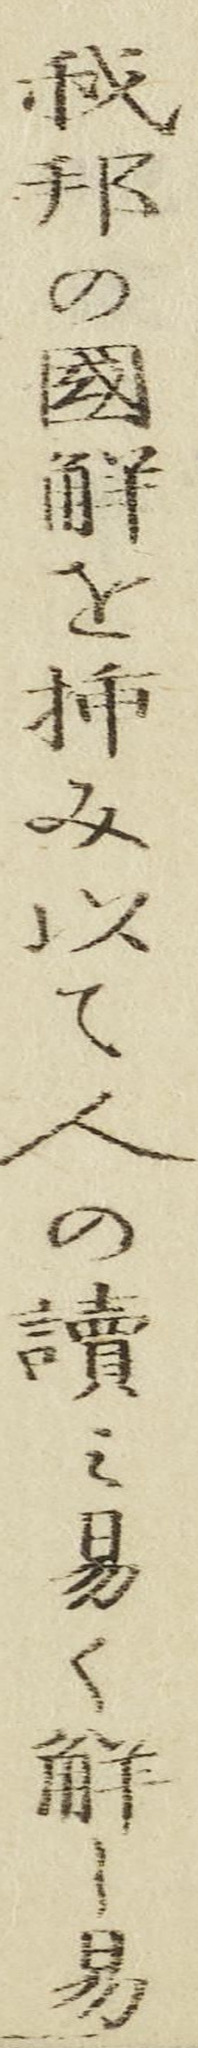我邦の国解を挿み以て人の読み易く解し易
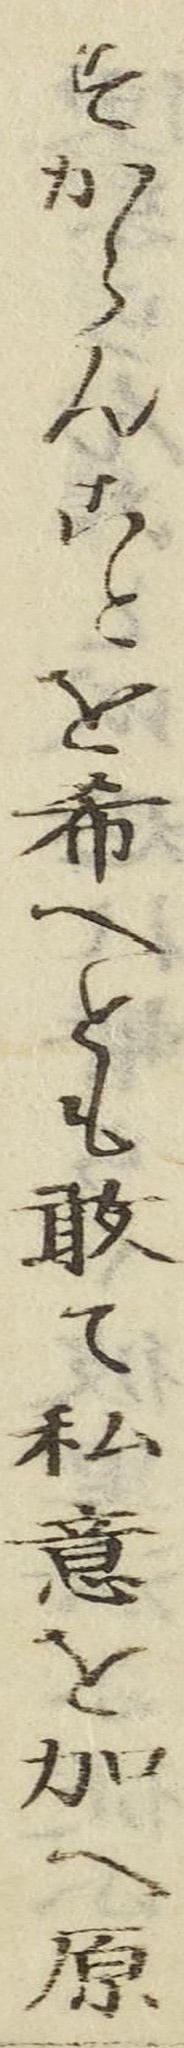すからんことを希へとも敢て私意を加え原
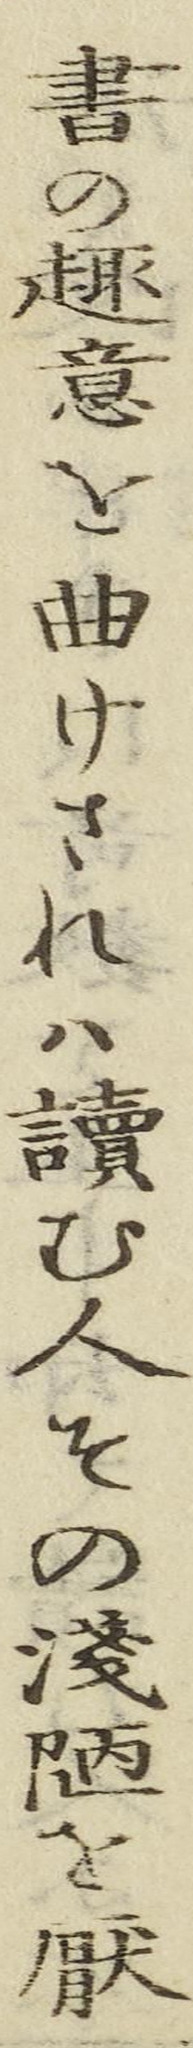書の趣意を曲げされは読む人その浅陋を厭
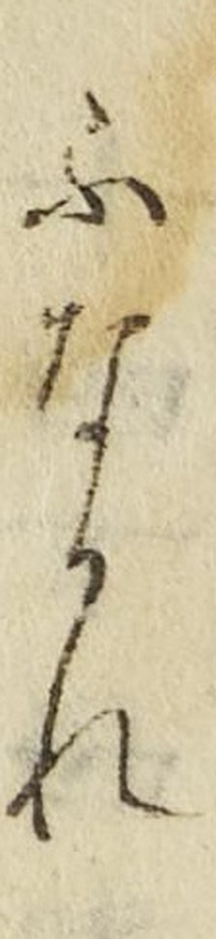ふなかれ
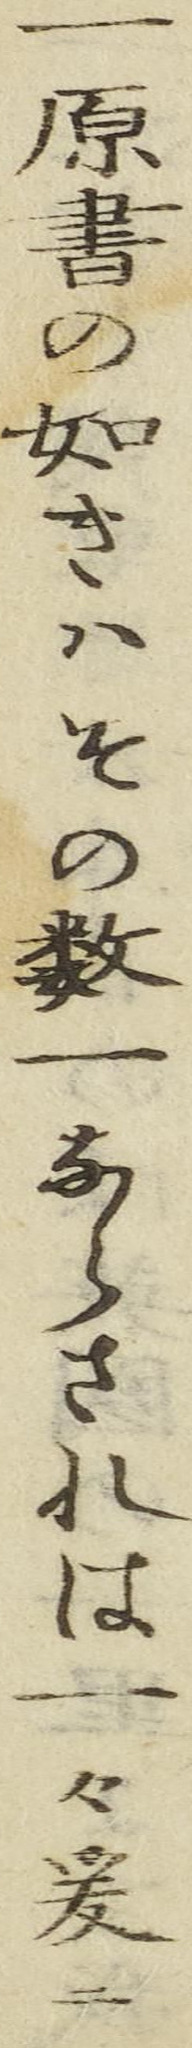一原書の如きはその数一ならされは一々爰に
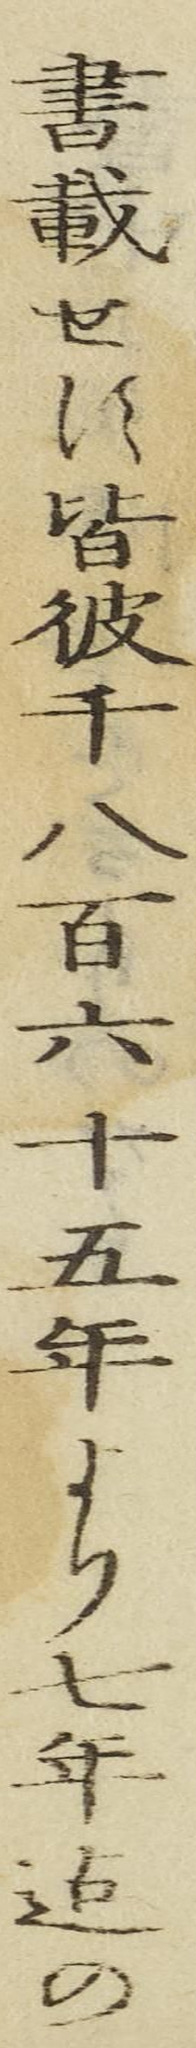書載せす皆彼千八百六十五年より七年迄の

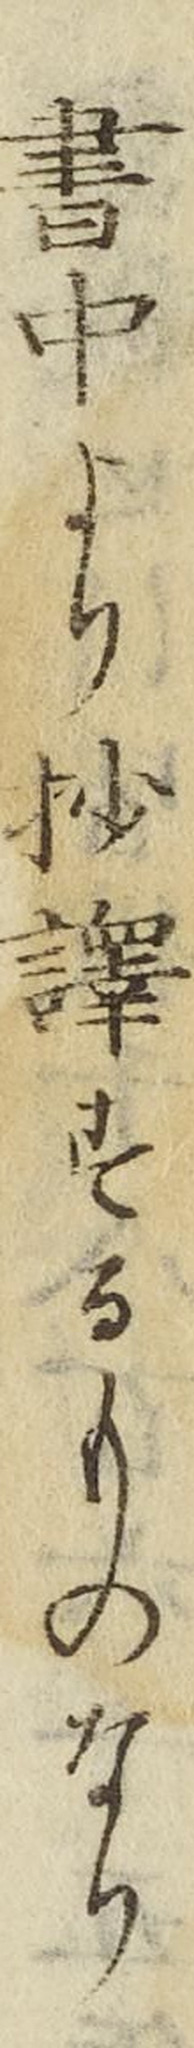書中より抄訳するものなり
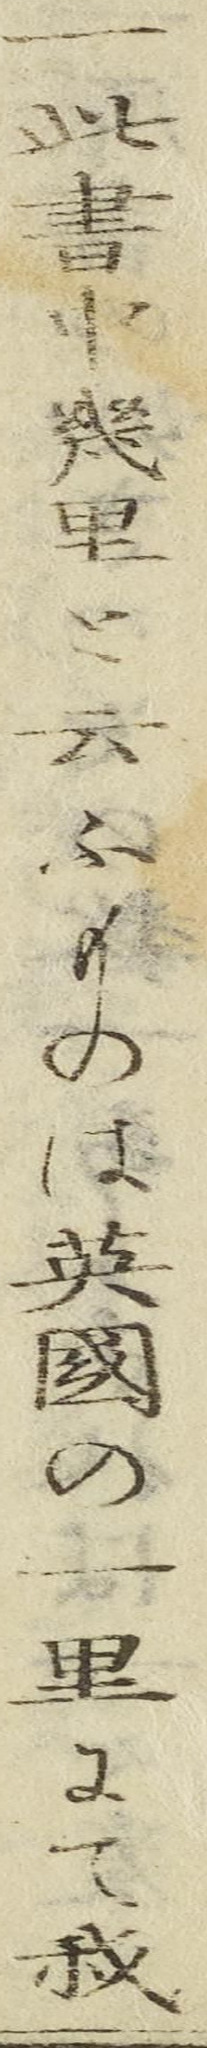一此書中幾里と云ふものは英国の一里にて我
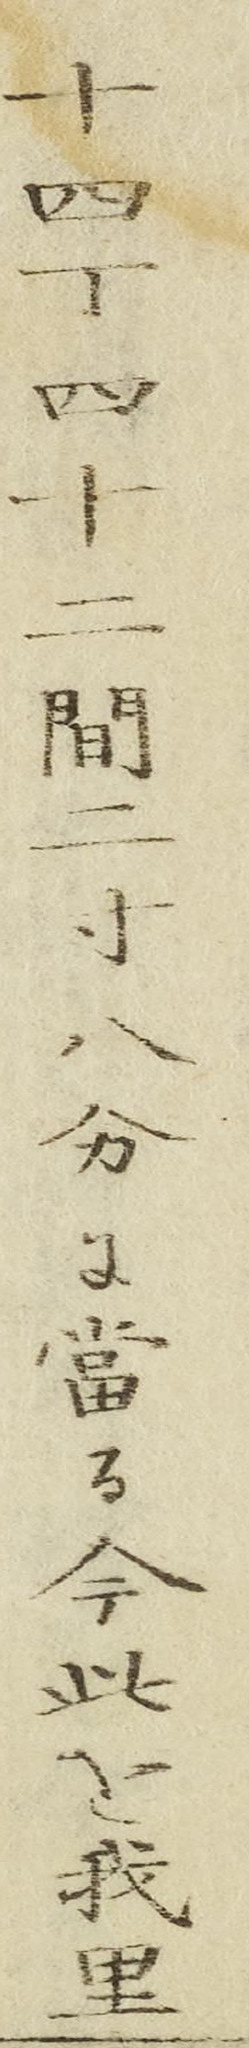十四丁四十二間二寸八分に当る今此を我里
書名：天変地異
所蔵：東京大学地震研究所図書室 Earthquake Research Institute Library, The University of Tokyo, JAPAN
